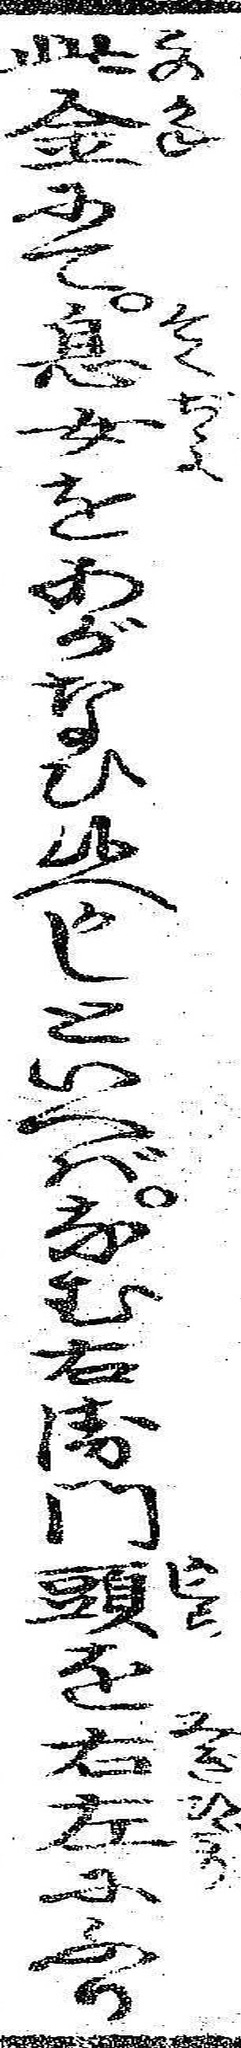此金にて。息女をあがなひ候へかしといへば。なむ右衛門頭を右左にふり
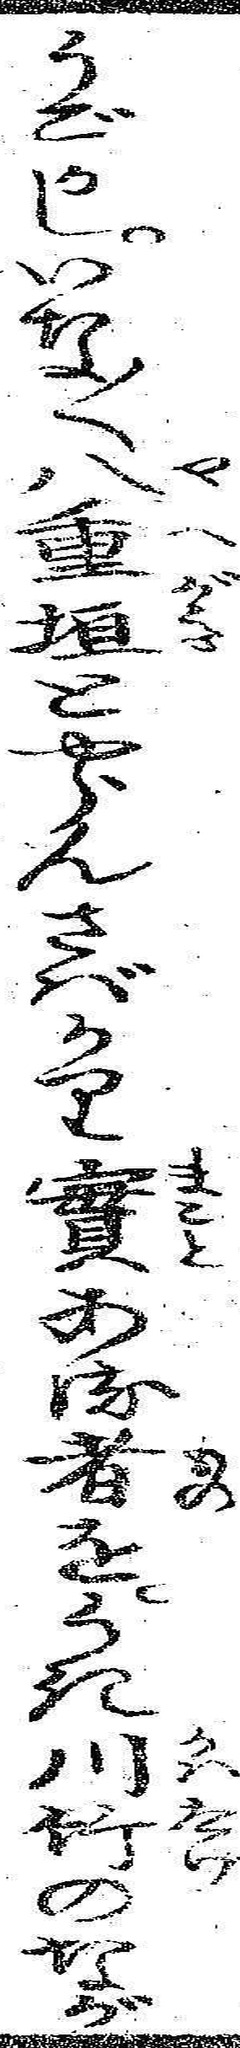うごかし。いな〳〵八重垣とやらんさばかり実ある者を。うき川竹のなが
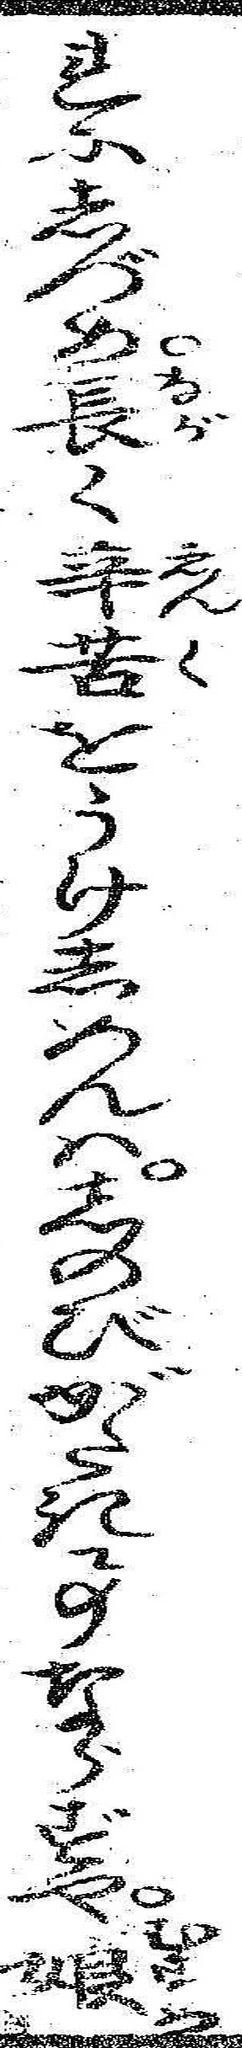れにしづめ。長く辛苦をうけしめんは。しのびがたき事ならずや。娘
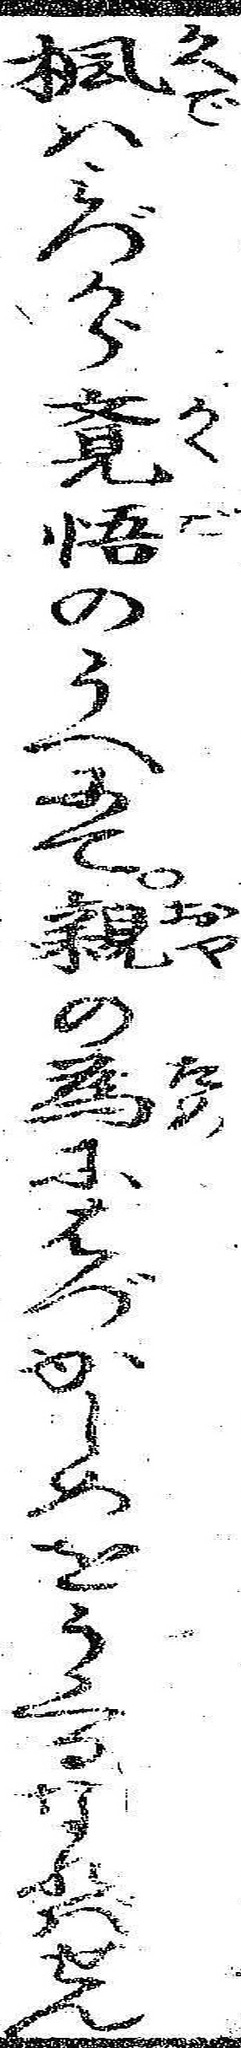楓はみづから斍悟のうへにて。親の為にはづかしめをうくるなればせん
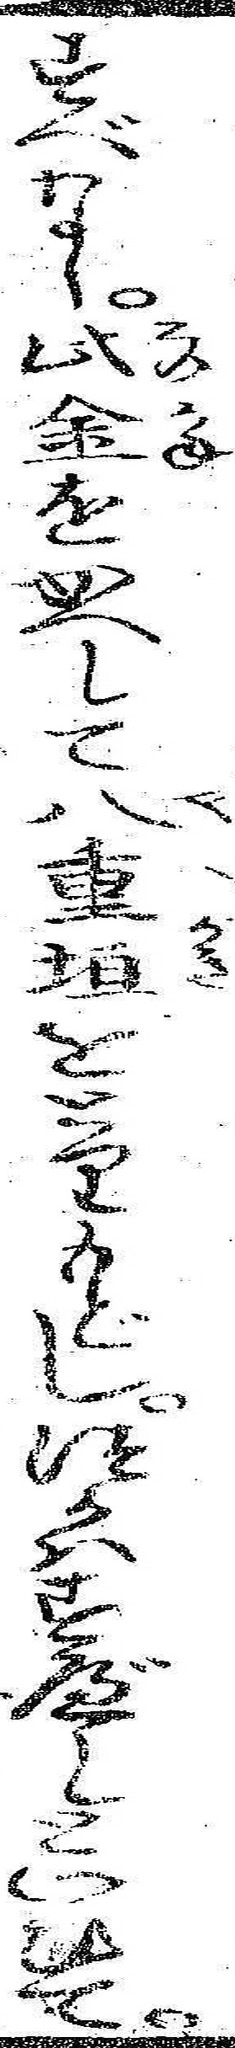すべなし。此金をかへして八重垣をとりもどし。つかはすべしといひて。
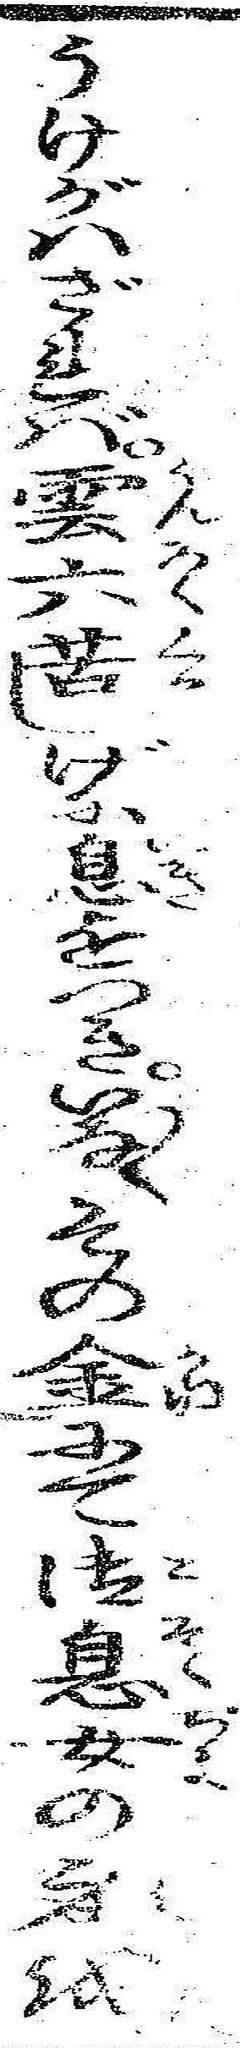うけがはざれば。雲六苦しげに息をつき。いな〳〵その金にて御息女の身を
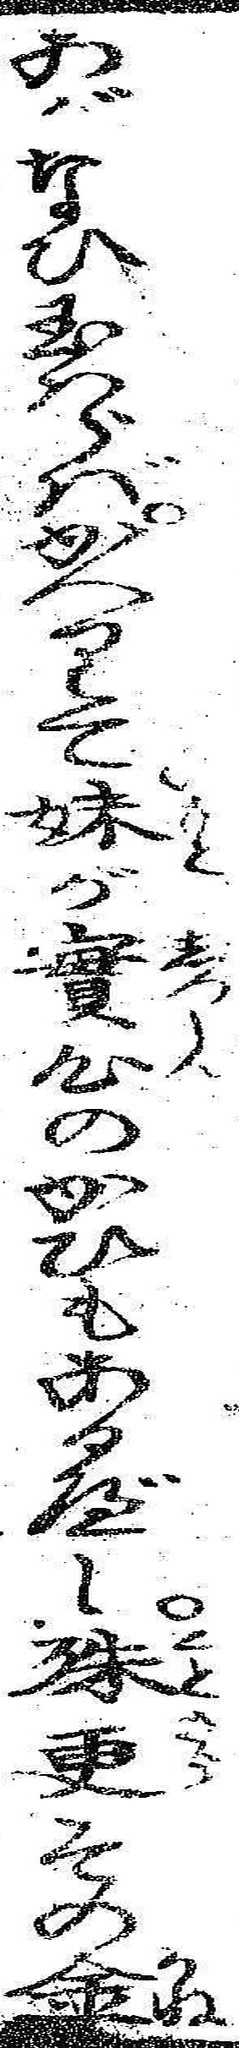あがなひ玉はらば。かへりて妹が実心のかひもあるべし。殊更その金
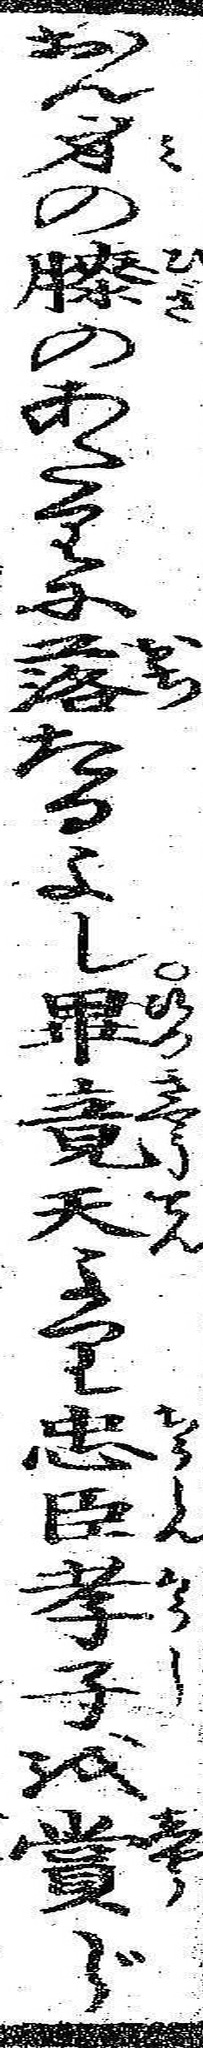おん身の膝のあたりに落たるよし。畢竟天より忠臣孝子を賞じ
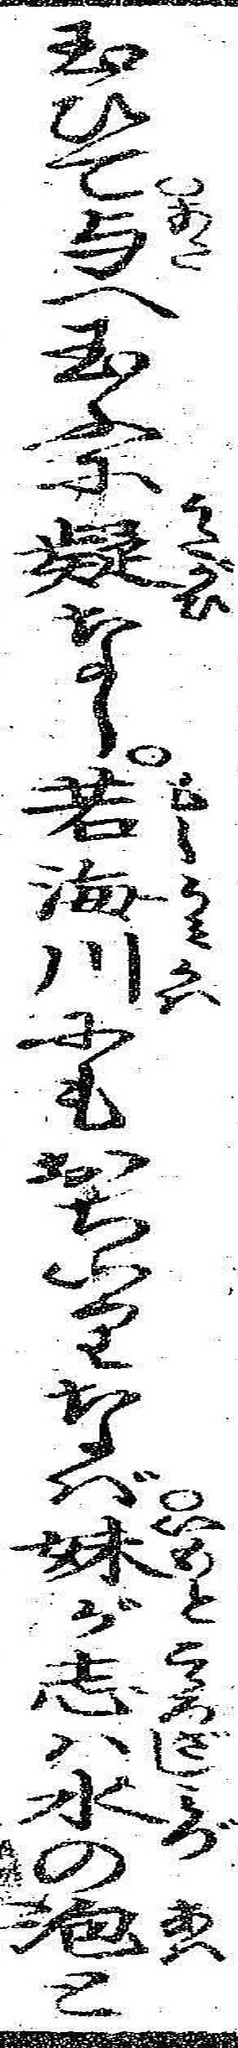玉ひて。与へ玉ふに疑なし。若海川にもおちいりなば。妹が志は水の泡と
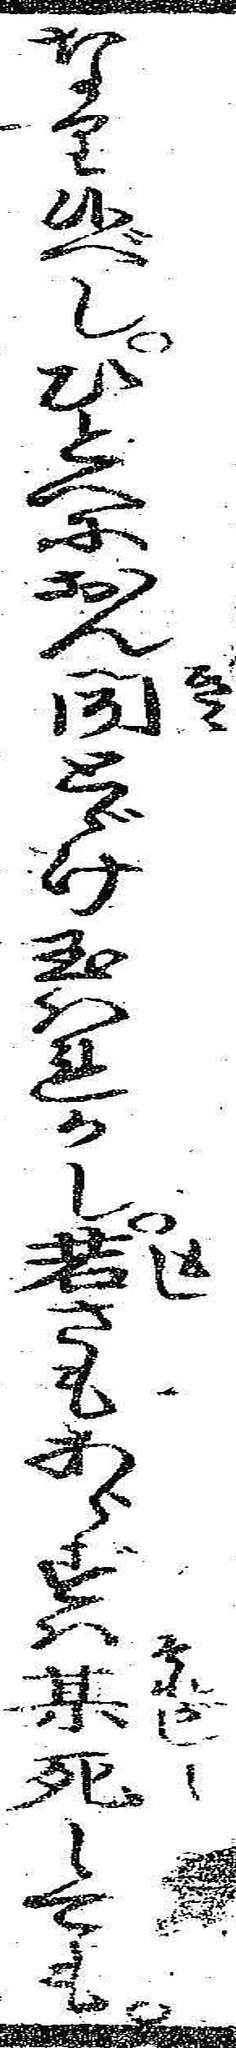なり候べし。ひとへにおん聞とゞけ玉はれかし。若さもあらずは某死しても。
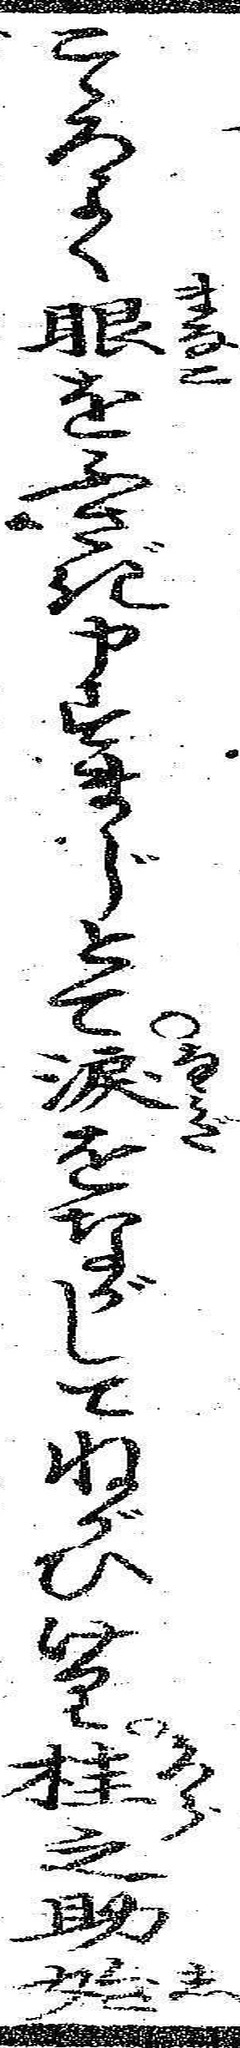こゝろよく眼をふさぎ申すまじとて。涙をながしてねがひけり。桂之助始
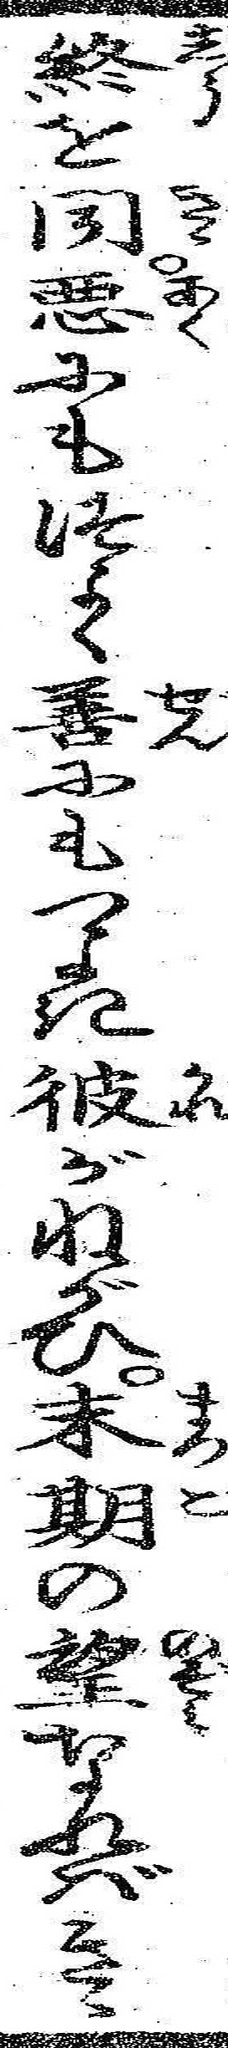終を聞。悪にもつよく善にもつよき彼がねがひ。未期の望なればきゝ
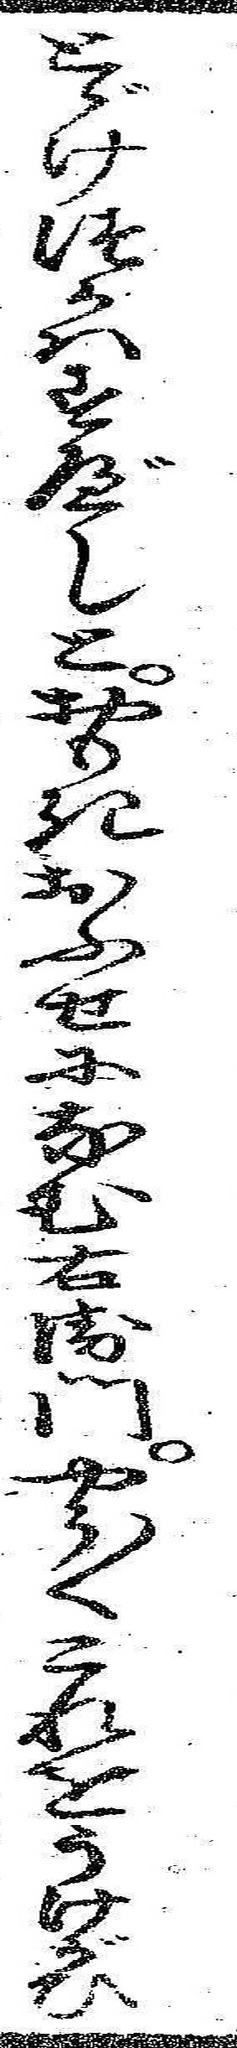とゞけつかはすべしと。おもきおふせになむ右衛門。やう〳〵これをうけがひ
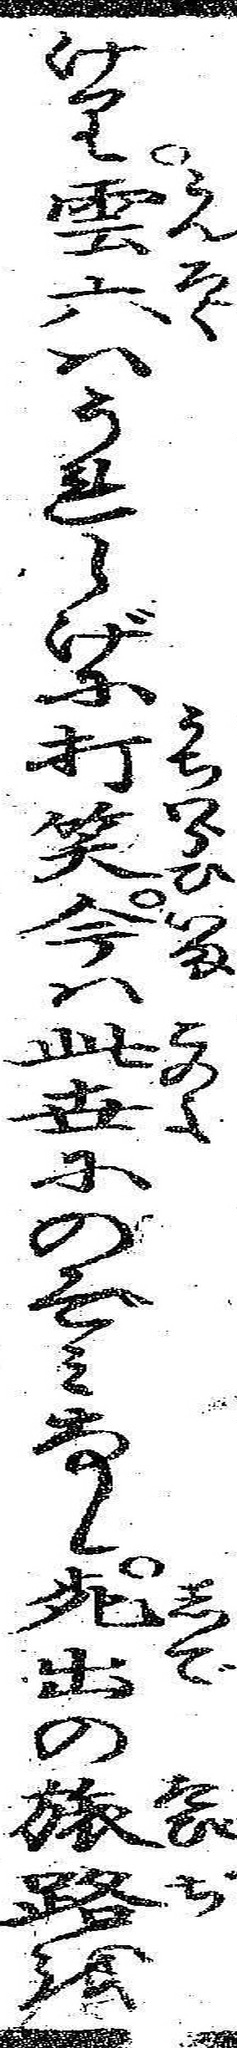けり。雲六はうれしげに打笑。今は此世にのぞみなし。死出の旅路を
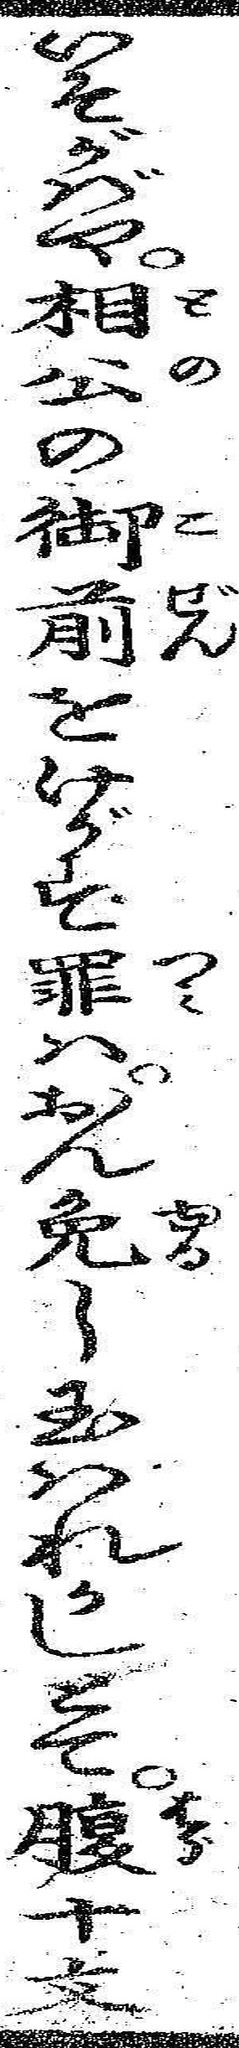いそがばや。相公の御前をけがす罪は。おん免し玉はれかしとて。腹十文
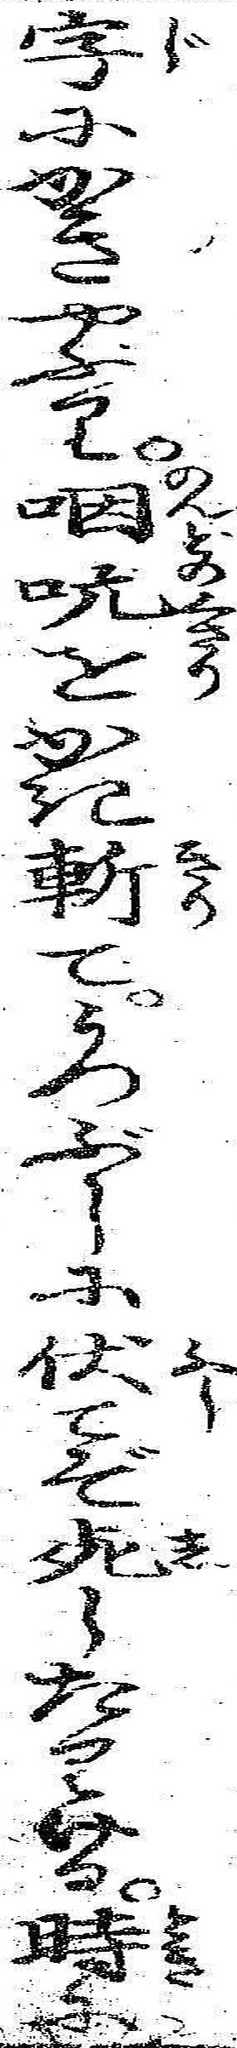字にかきやぶり。咽吭をかき斬て。うつぶしに伏てぞ死したりける。時に
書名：昔話稲妻表紙
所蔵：国文学研究資料館
